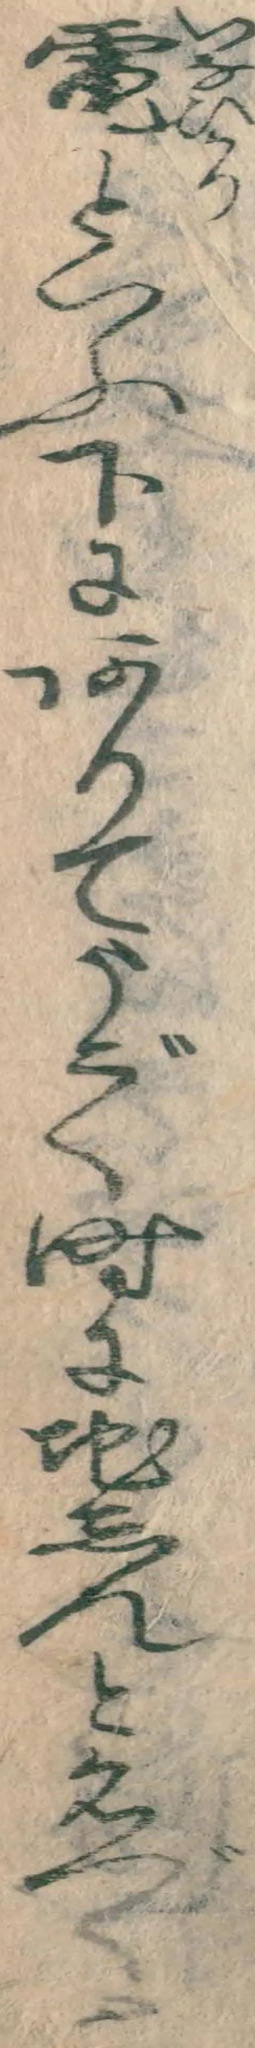電といふ下にありてうごく時に地しんと名づくと

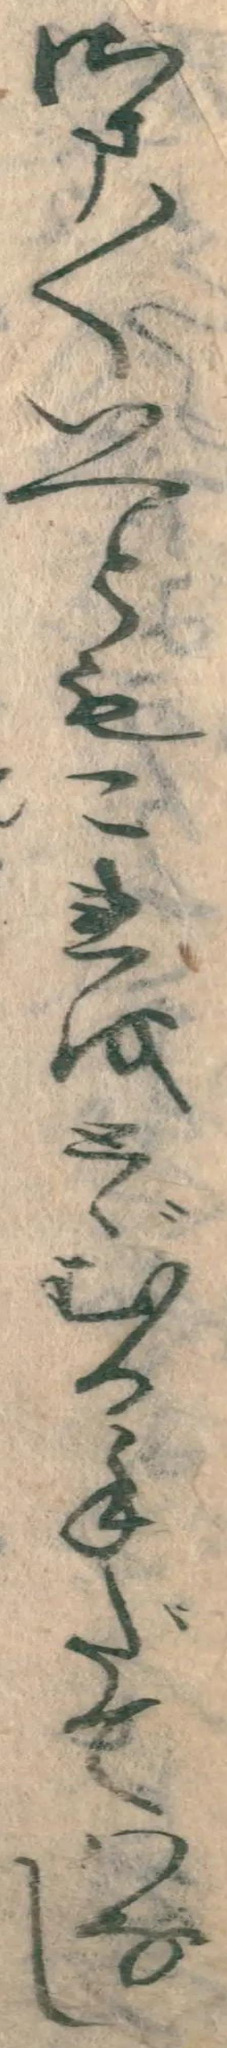さま〳〵いへともこれをとゞむる手だてはなし
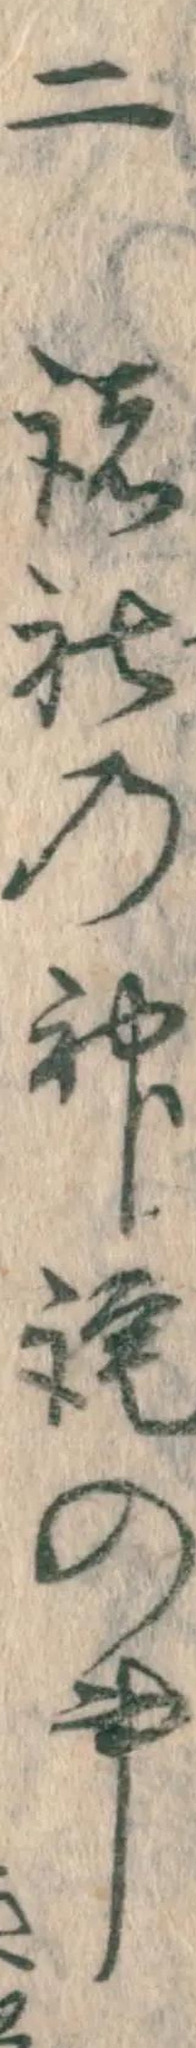二諸社の神託の事
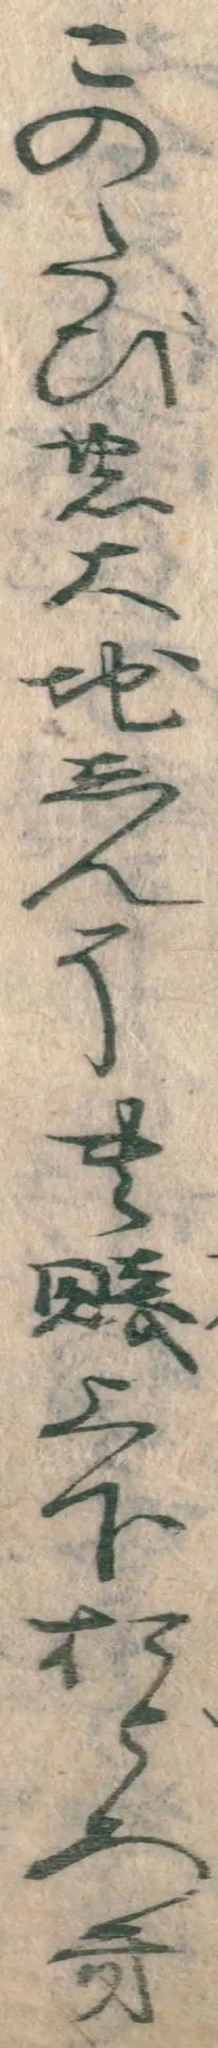このたひの大地しんに貴賤上下おどろき
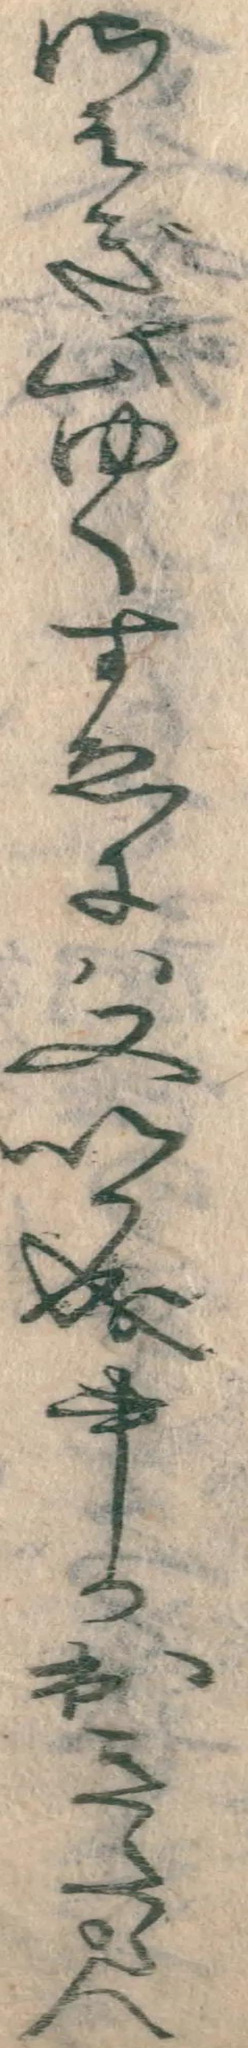さはぎ此ゆくすゑには又いか成事か出きたらん
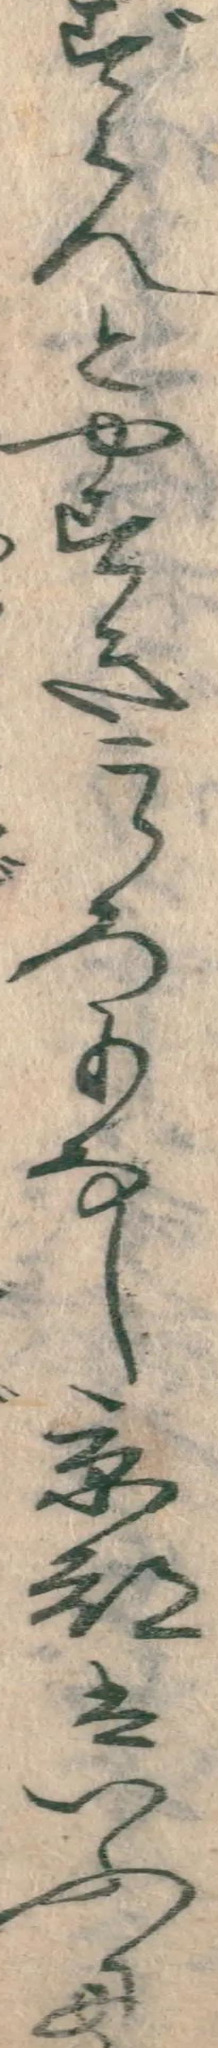ずらんとやすきこゝろもなし京都はいふに
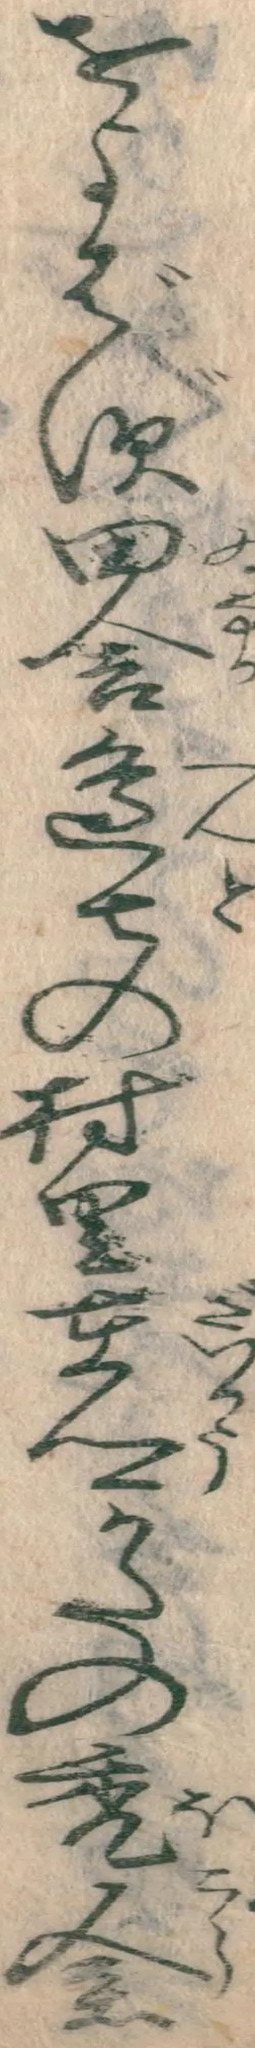をよばずいなか田舎邊土の村里在郷かたの秀倉
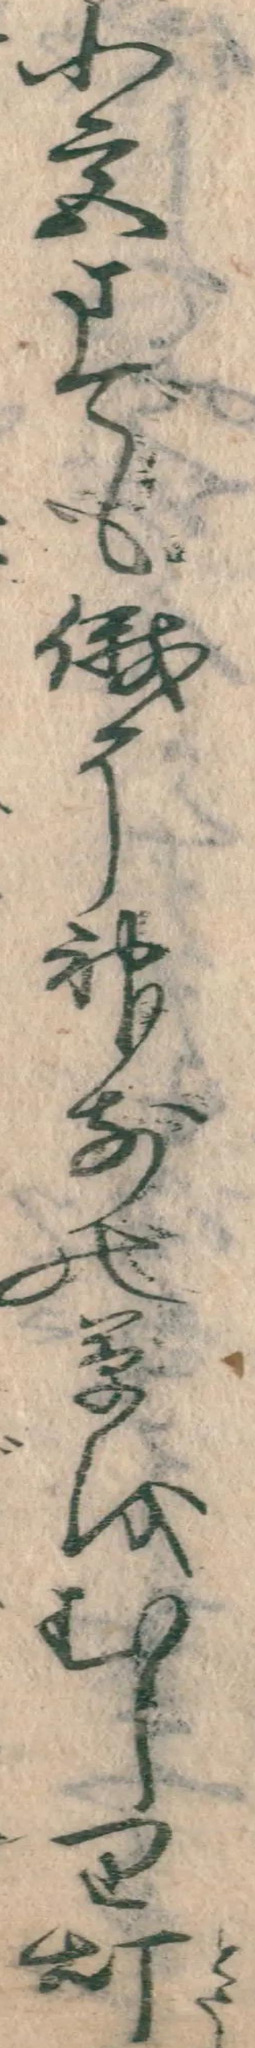小宮までも俄に神前の草をむしり灯
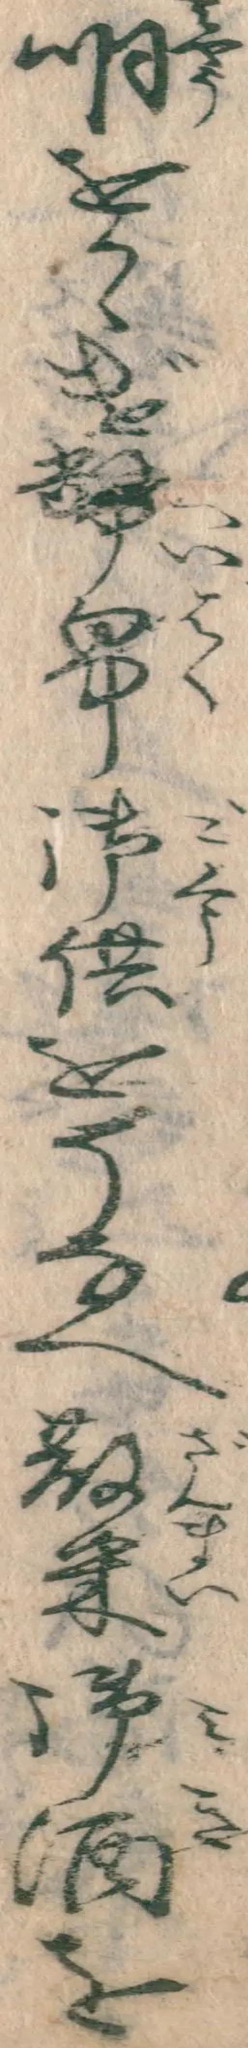明をかゝげ幣帛御供をそなへ散米御酒を
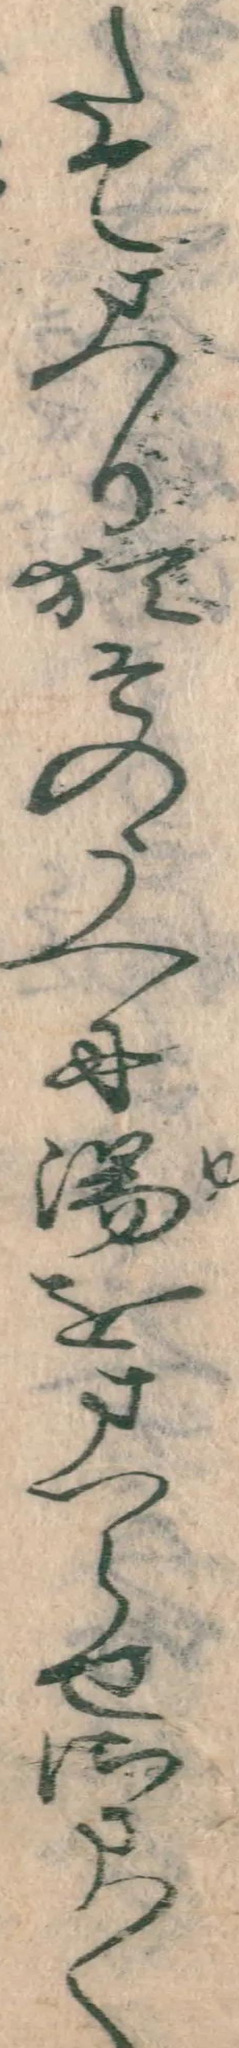たてまつり猶そのうへに湯をまいらせさまつく
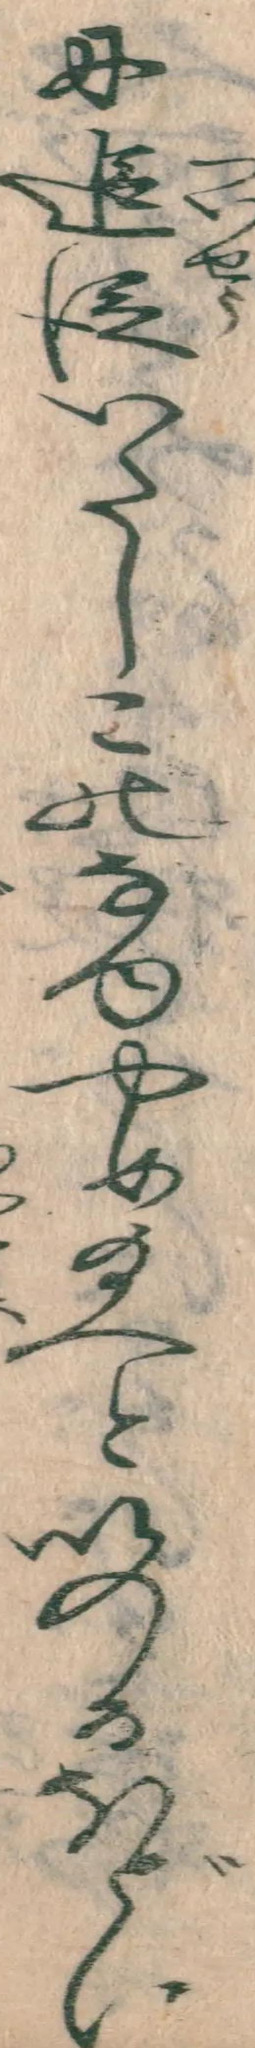に追従いたしこのなゆやめ給へといのるほどに
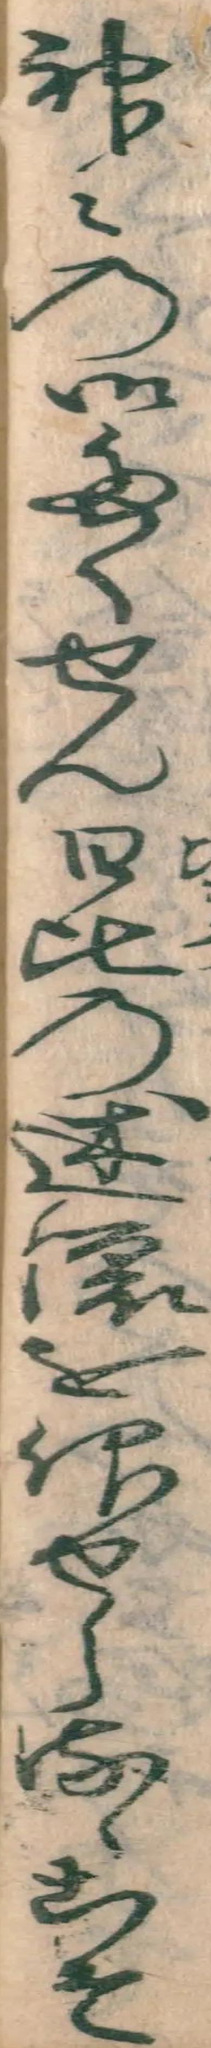神この御たくせん日比の述懐を報せらるゝこそ
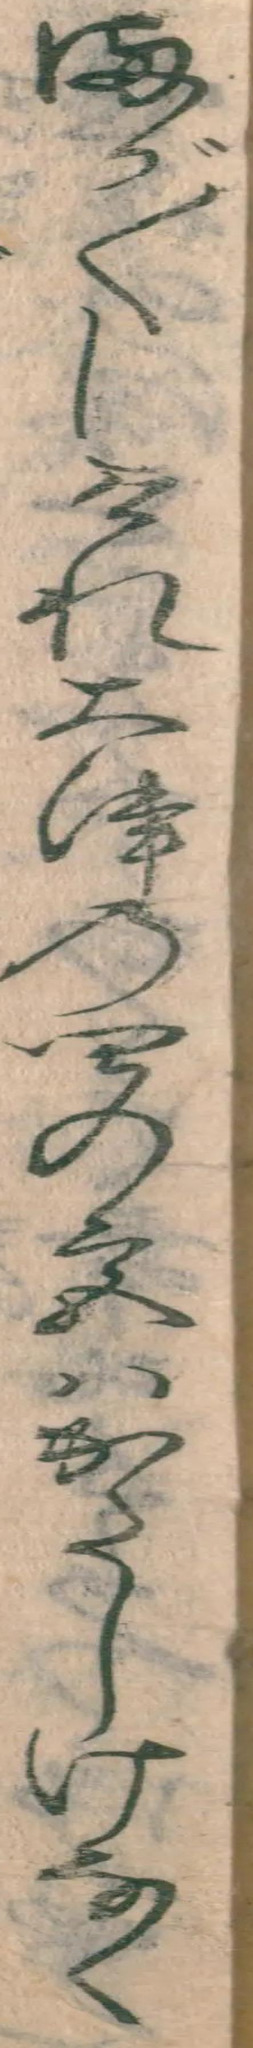まが〳〵しけれ大津の四の宮はかたしけなく
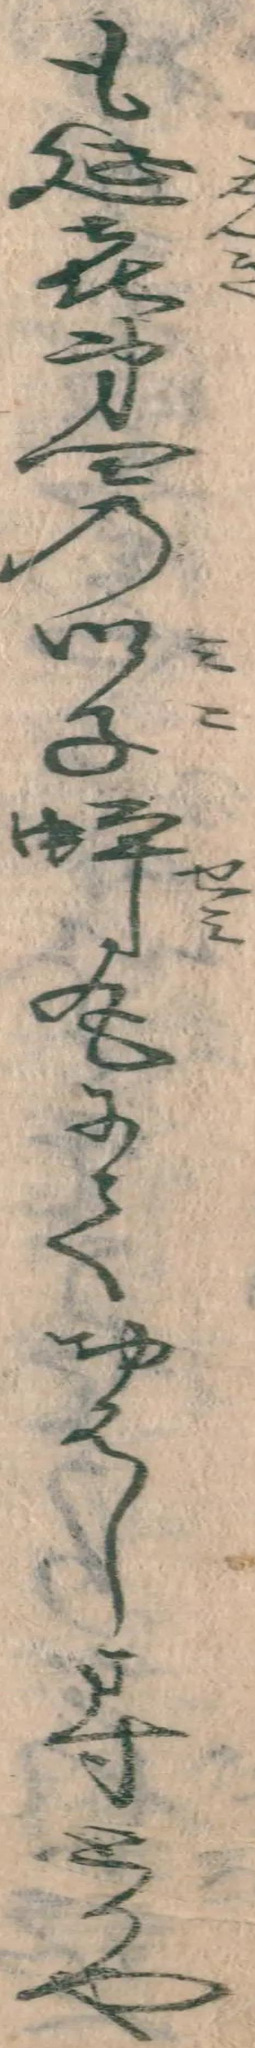も延喜第四の御子蝉丸にておはしますとかや
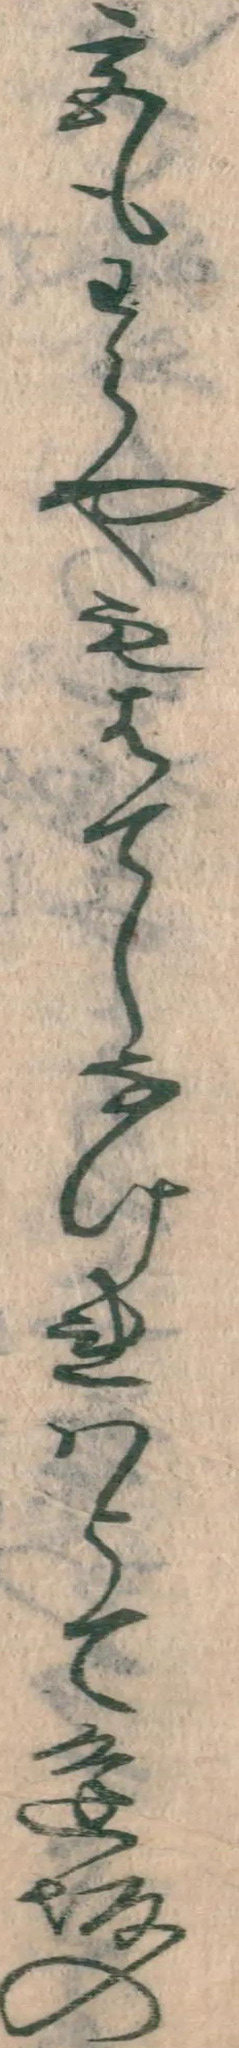宮もわらやもはてしなけれはとて逢坂の
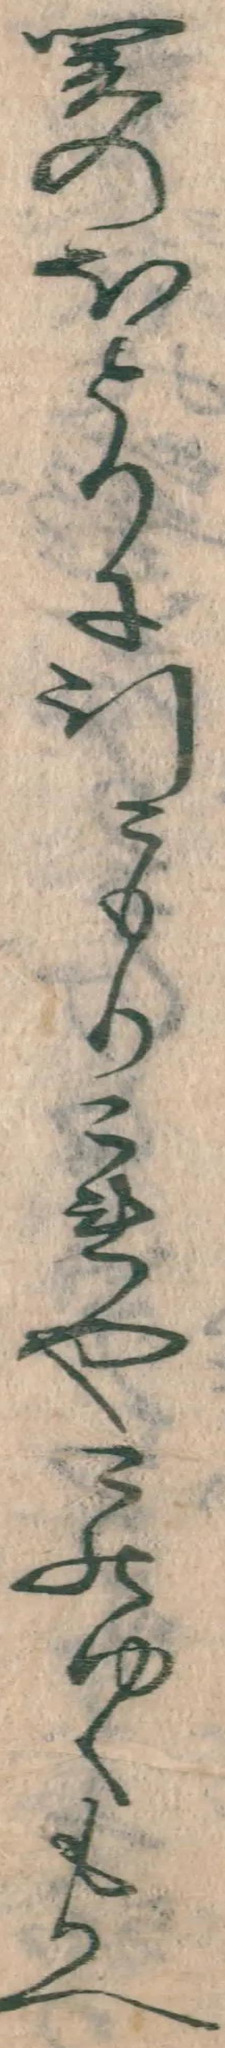関のほとりに引こもりこれやこのゆくもかへ
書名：艱難目異志. 上,下
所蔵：国立国会図書館 National Diet Library, JAPAN
